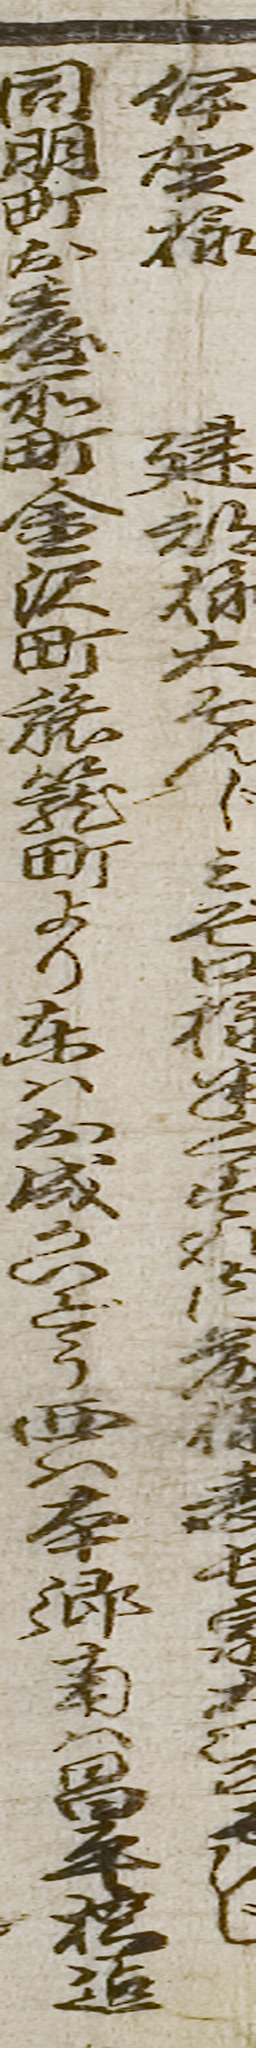同朋町お土蔵所町金沢町旅籠より東ハお成かいどう西ハ本郷南ハ昌平橋迄
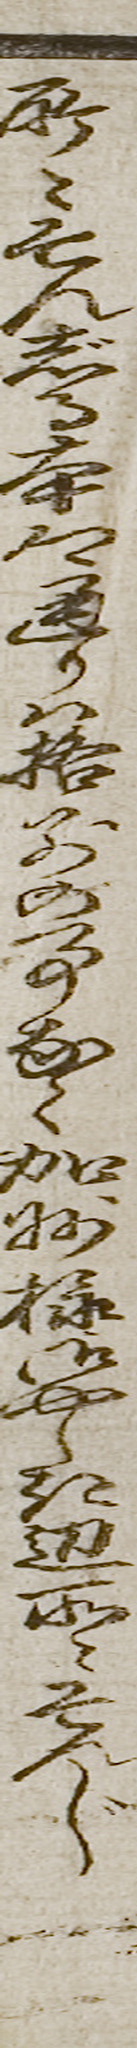所々そんじる本郷通りハ格別の事なく加州様御やしき辺所々そんじ
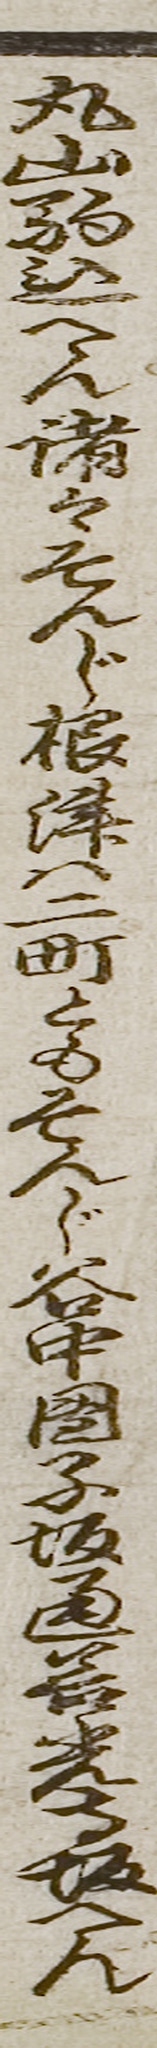丸山駒込へん諸々そんじ根津ハ二町ともそんじ谷中団子坂通善光寺坂へん
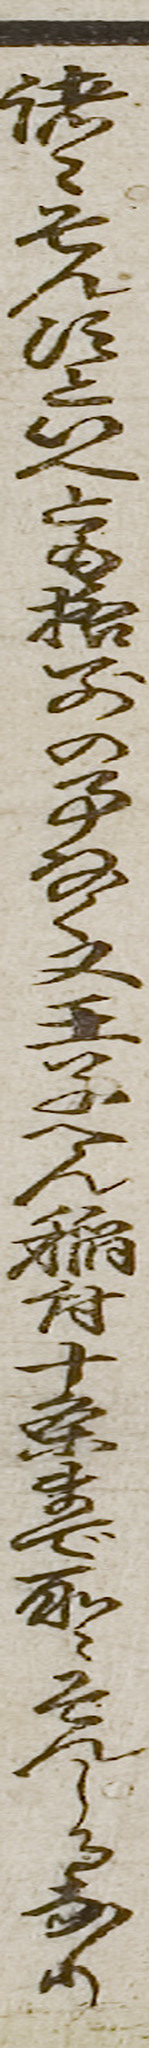諸々そんすといへとも格別の事なく又王子へん稲荷十条まで所々そんじるなり
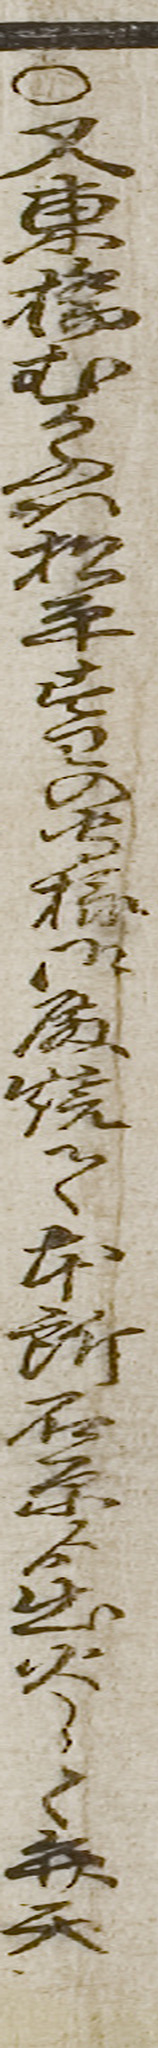○又東橋むかふハ松平すわの守様御殿焼て本所石原より出火して弁天
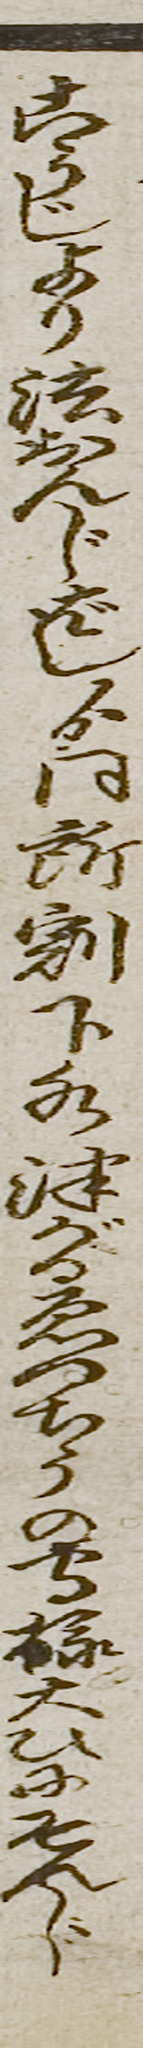こうじより法おんじばしより同所割下水津がるえっちうの守様大ひにそんじ
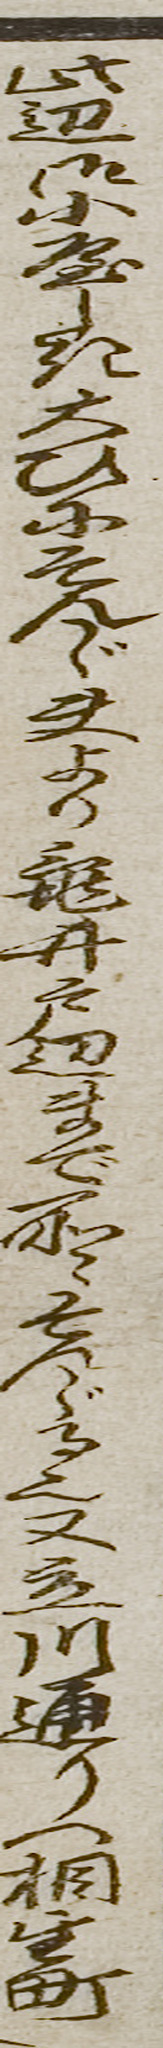此辺御小屋しき大ひにそんじ夫より亀井戸辺まで所々そんじる也又立川通りへ相生町
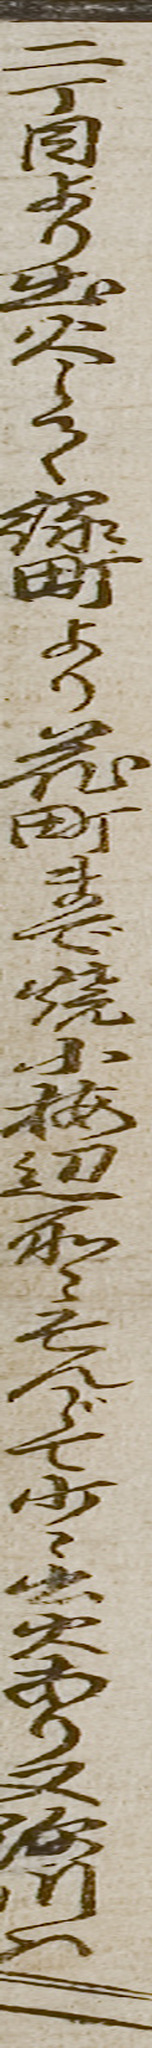二丁目より出火して緑町より花町まで焼小梅辺所々そんじて少々出火あり又深川ハ
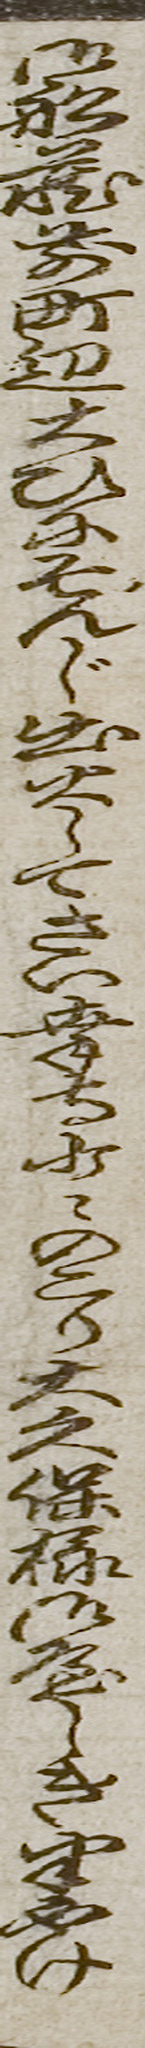御船蔵前町辺大ひにそんじ出火してさい幸寺少々のこり大久保様御屋しき半やけ
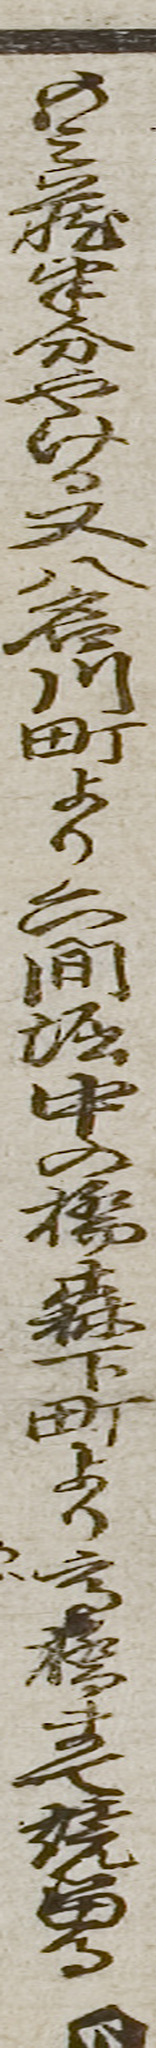のみ蔵半分やける又八名川町より六間堀中の橋森下町より高橋まで焼留る
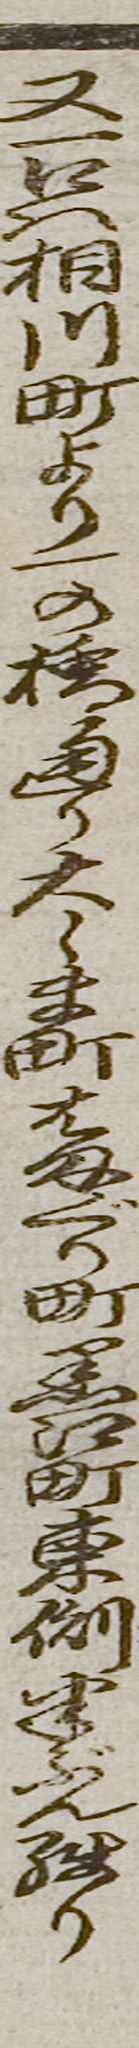又一口ハ相川町より一の橋通り大しま町はまぐり町黒江町東側半ぶん残り
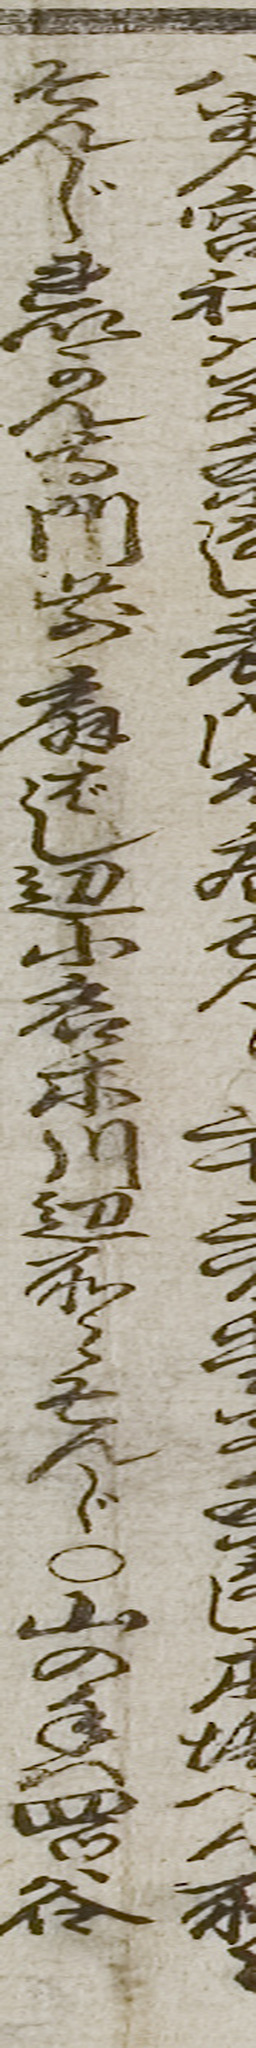そんじ靈かん寺門前扇ばし辺小名木川辺所々そんじ○山の手ハ四ツ谷

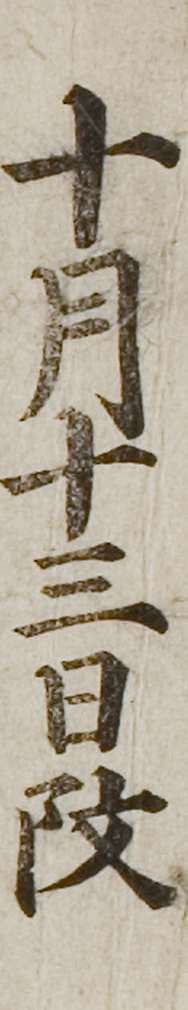十月十三日
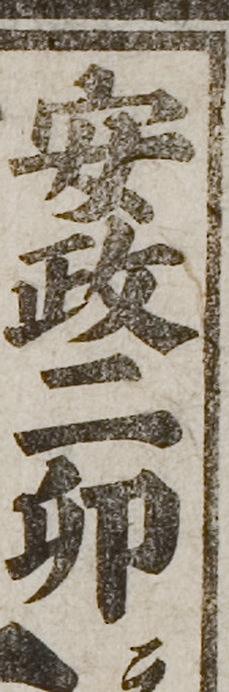安政二卯
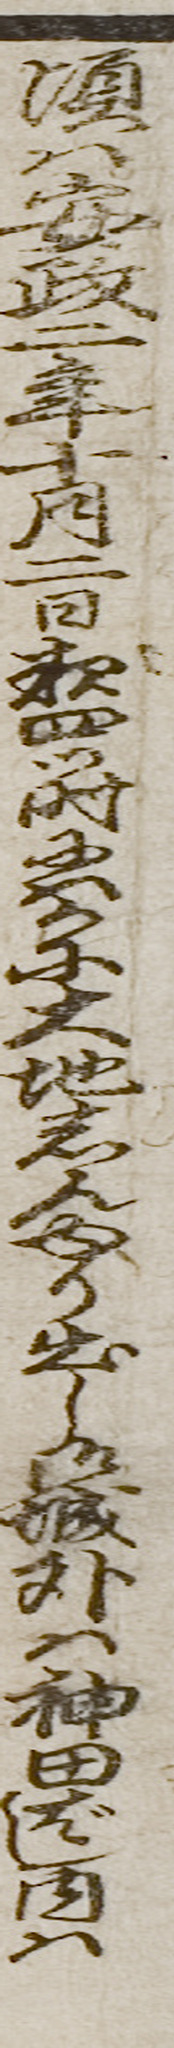頃は安政二年十月二日夜四ッ時にはかに大地しんゆり出し御城外は神田ばし内は
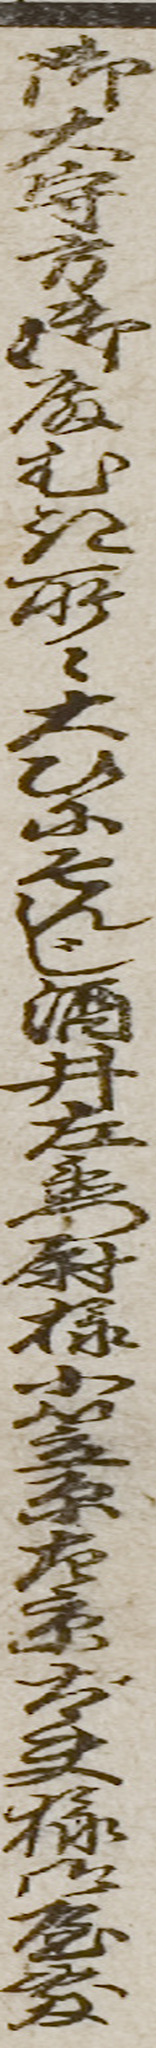御大守方御殿むき所々大ひにそんじ酒井左衛門尉様小笠原左京太夫様御屋敷
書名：江戸大地震出火場所分
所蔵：東京大学総合図書館 General Library in the University of Tokyo, JAPAN
